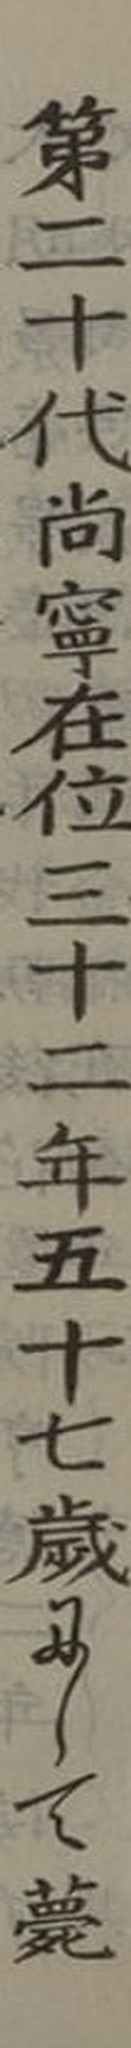第二十代尚寧在位三十二年五十七歳にして薨
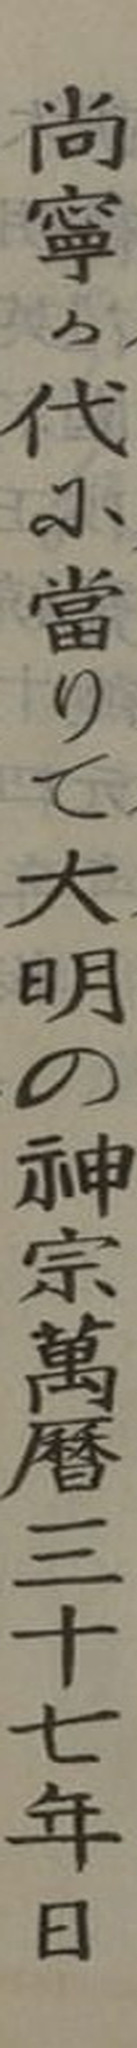尚寧か代に當りて大明の神宗萬曆三十七年日
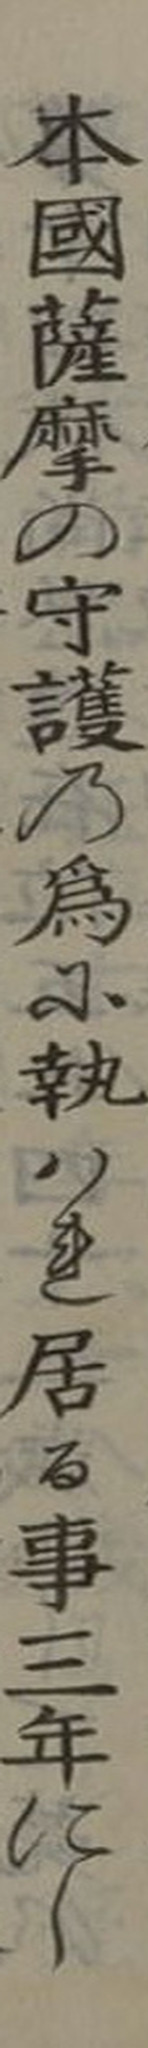本國薩摩の守護の爲に執はれ居る事三年にし
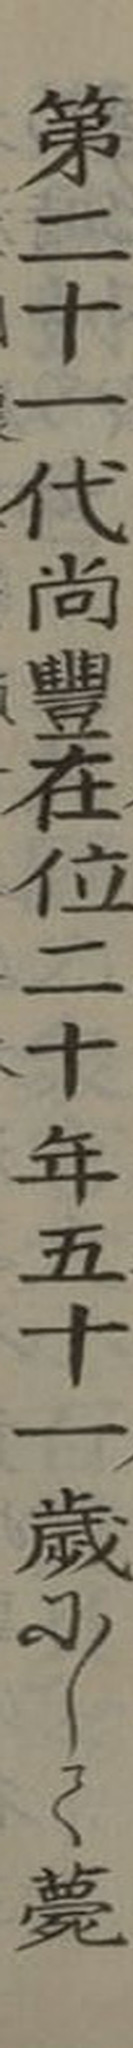第二十一代尚豐在位二十年五十一歳にして薨
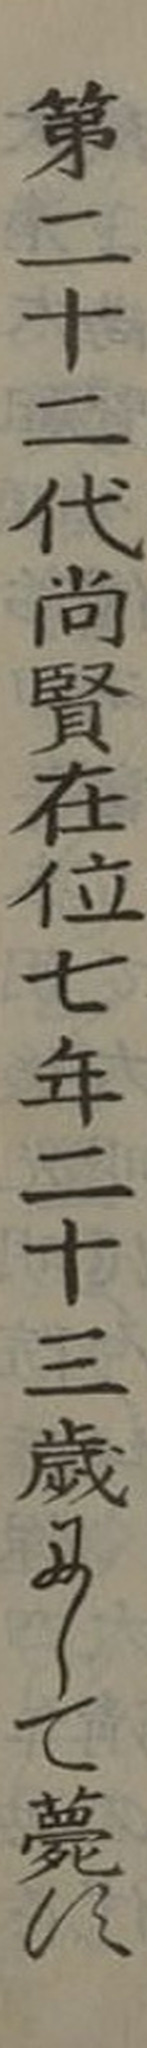第二十二代尚賢在位七年二十三歳にして薨す

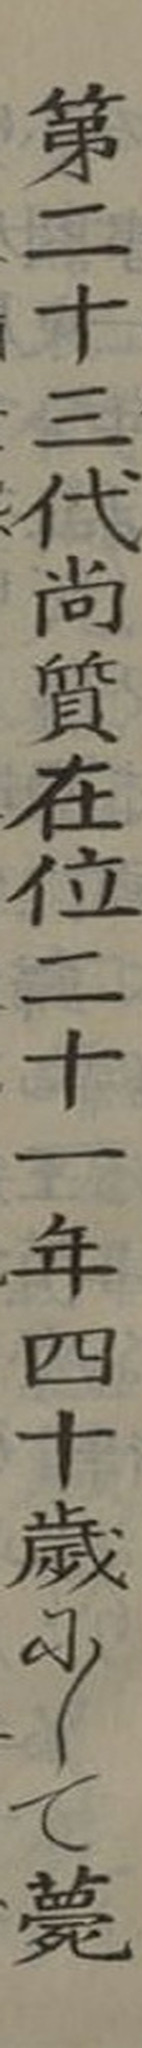第二十三代尚質在位二十一年四十歳にして薨
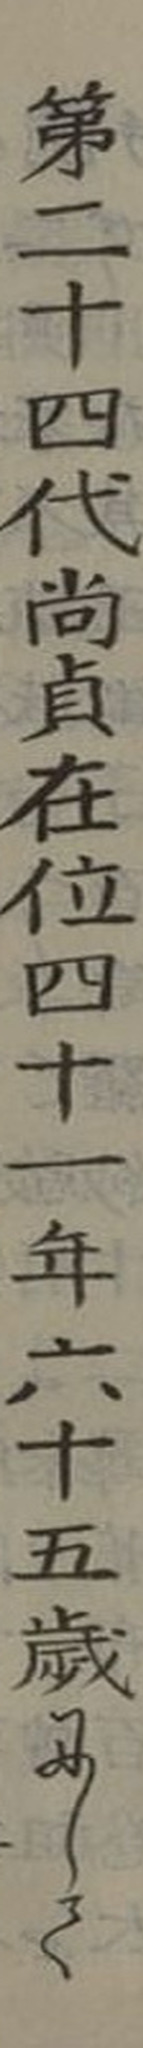第二十四代尚貞在位四十一年六十五歳にして
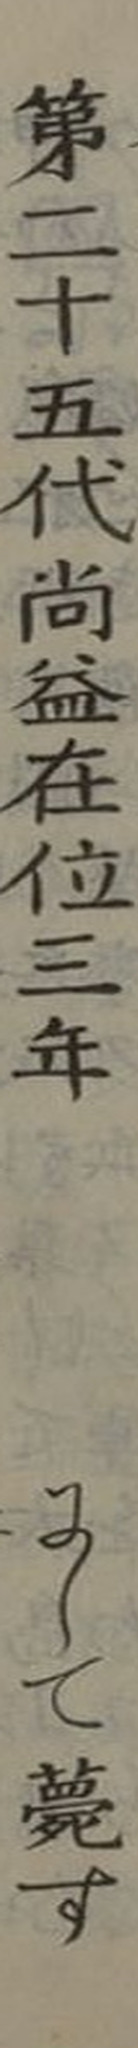第二十五代尚益在位三年にして薨す
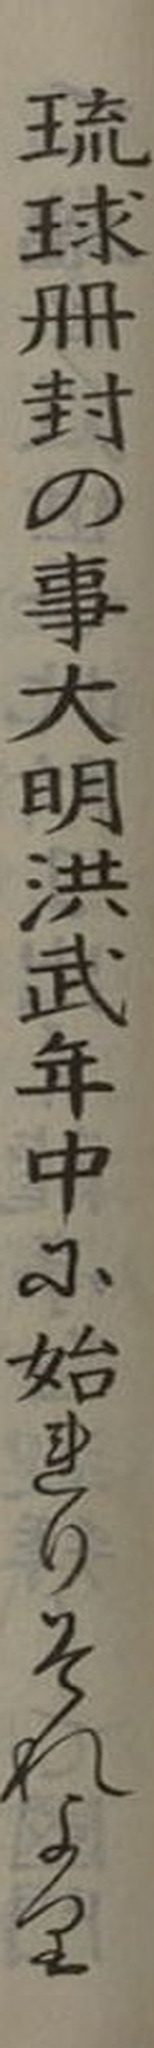琉球冊封の事大明洪武年中に始れりそれより
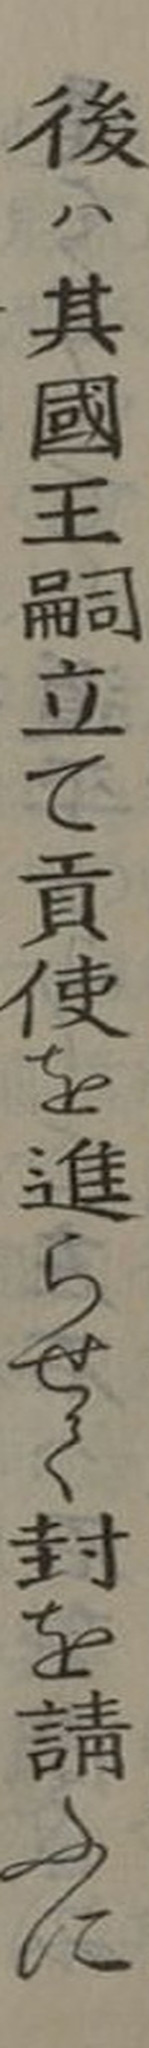後は其國王嗣立て貢使を進らせて封を請ふに
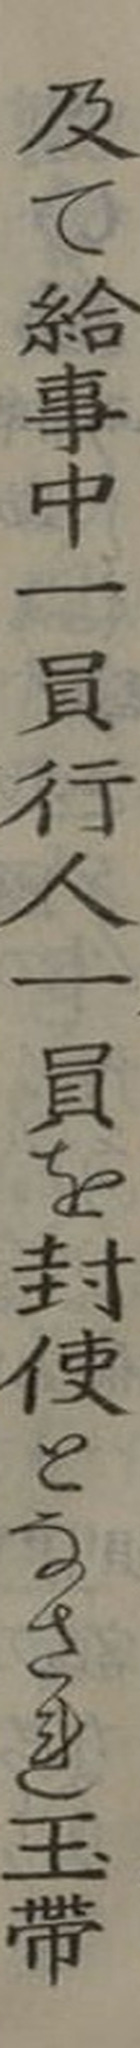及て給事中一員行人一員を封使となされ玉帶
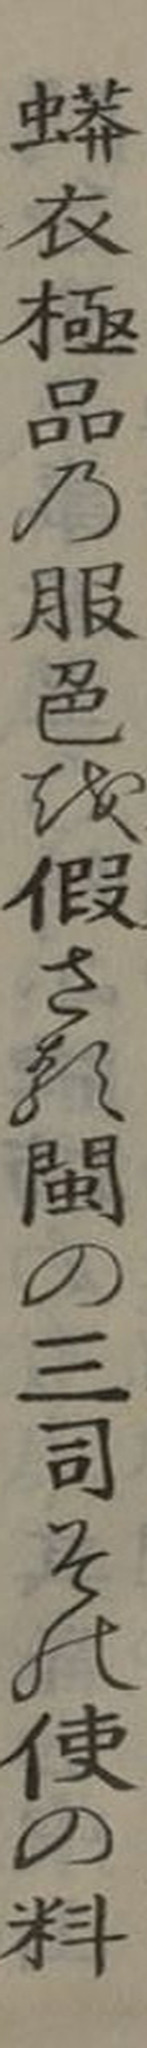蟒衣極品の服色を假さる閩の三司その使の料
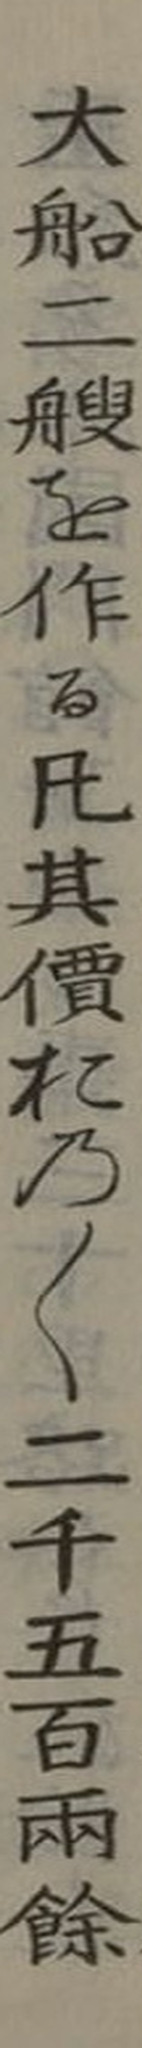大船二艘を作る凡其價おの〳〵二千五百兩餘
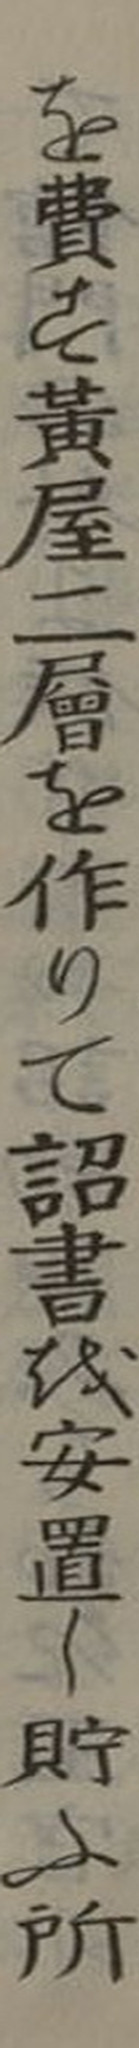を費す黃屋二層を作りて詔書を安置し貯ふ所
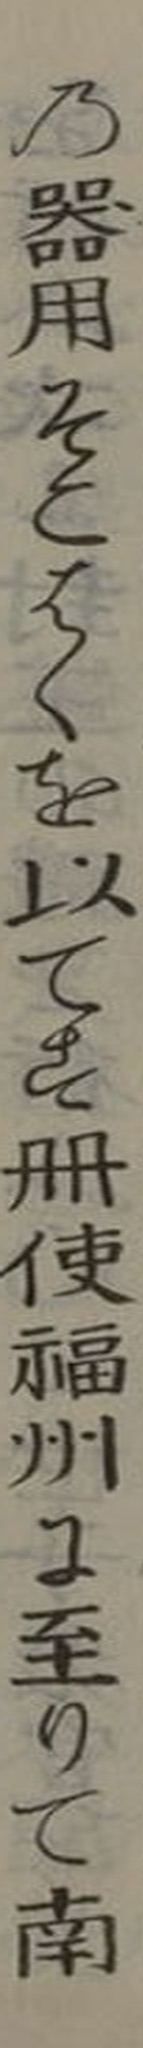の器用そこはくを以てす冊使福州に至りて南
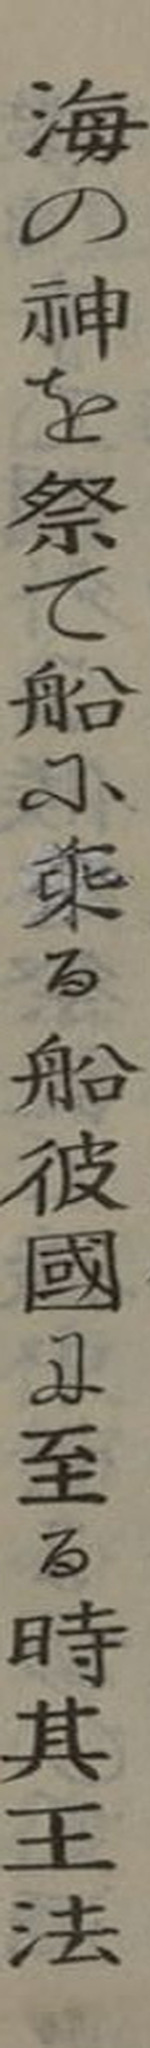海の神を祭て船に乘る船彼國に至る時其王法
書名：骨董録
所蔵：University of the Ryukyus Library
